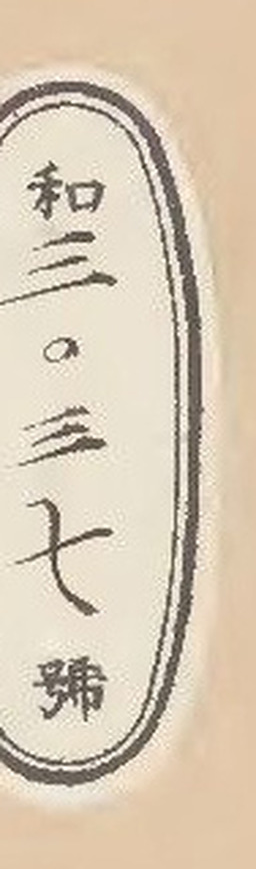和三〇三七号
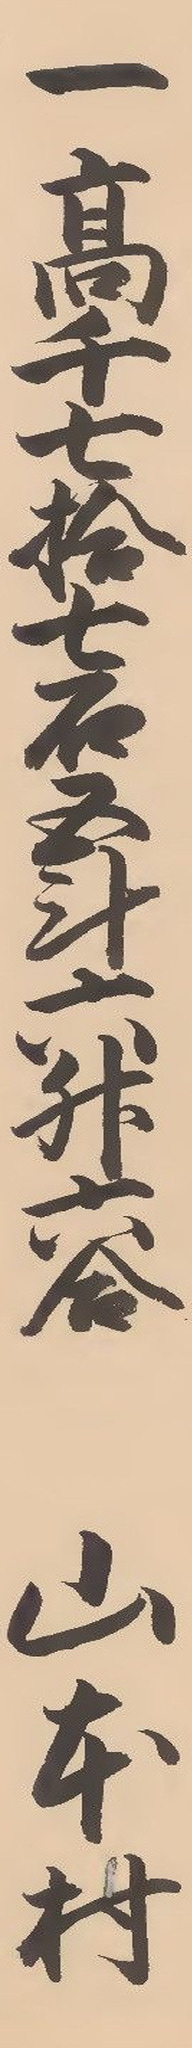一高千七拾七石五斗六升六合山本村
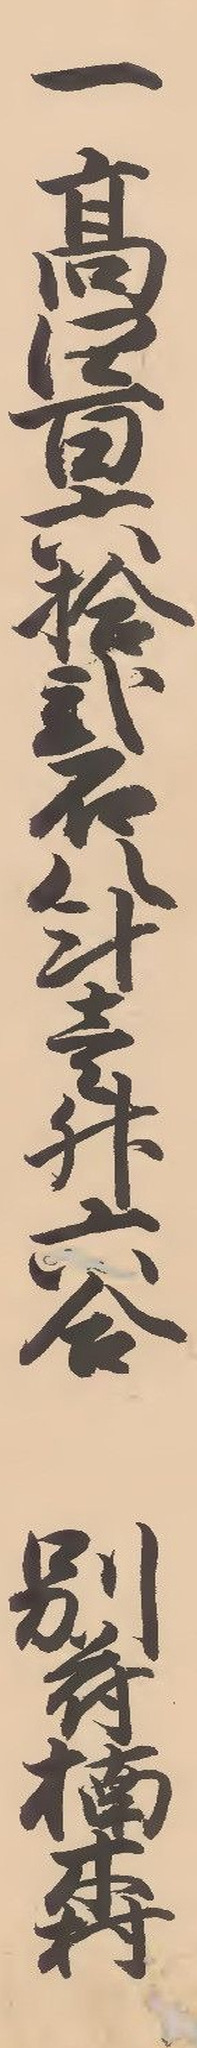一高四百六拾弐石八斗壱升六合別府楠木村

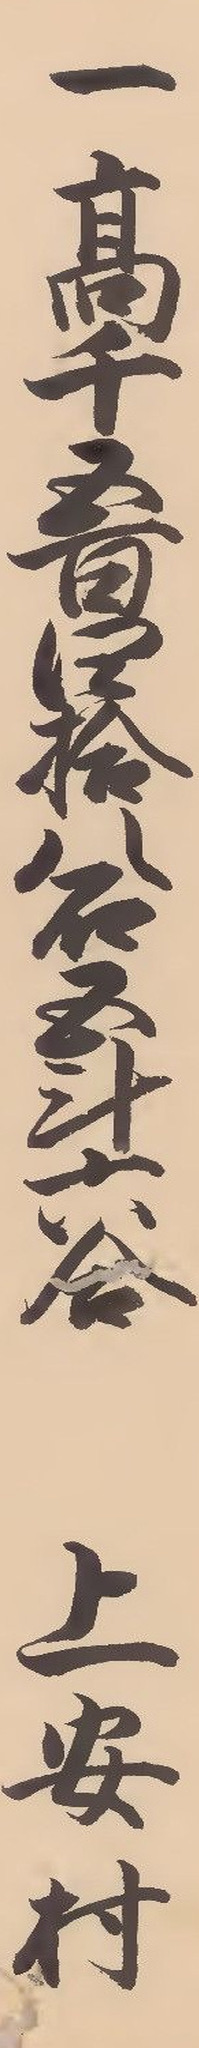一高千五百四拾八石五斗六合上安村
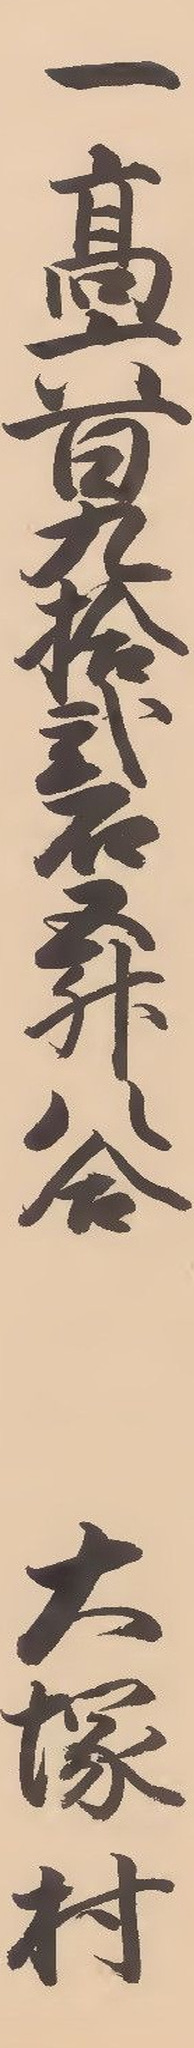一高六百九拾弐石五升八合大塚村
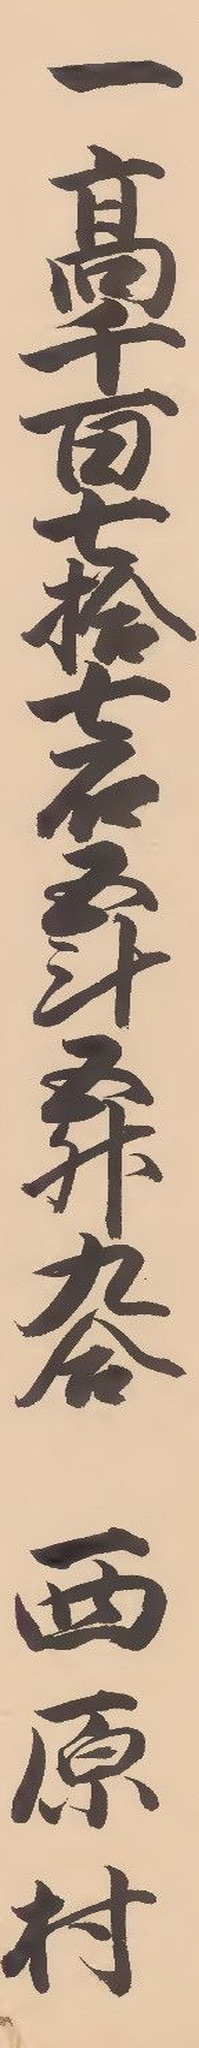一高千百七拾七石五斗五升九合西原村
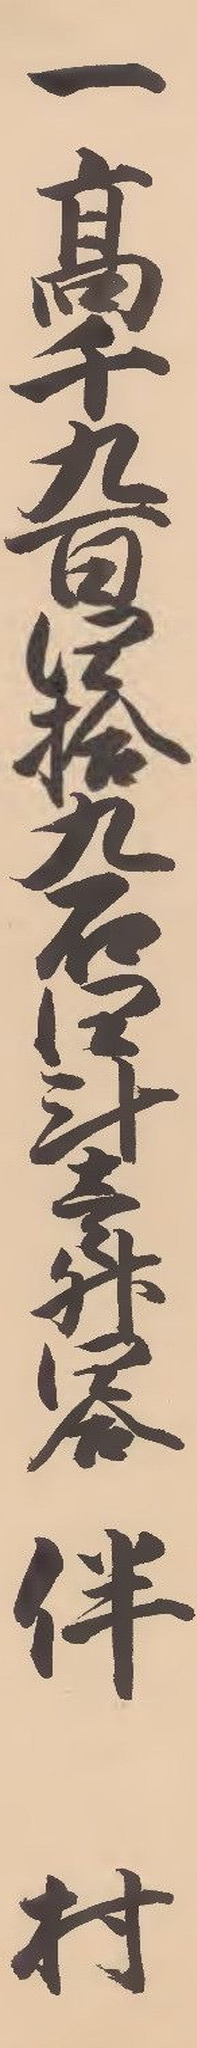一高千九百四拾九石四斗壱升四合伴村
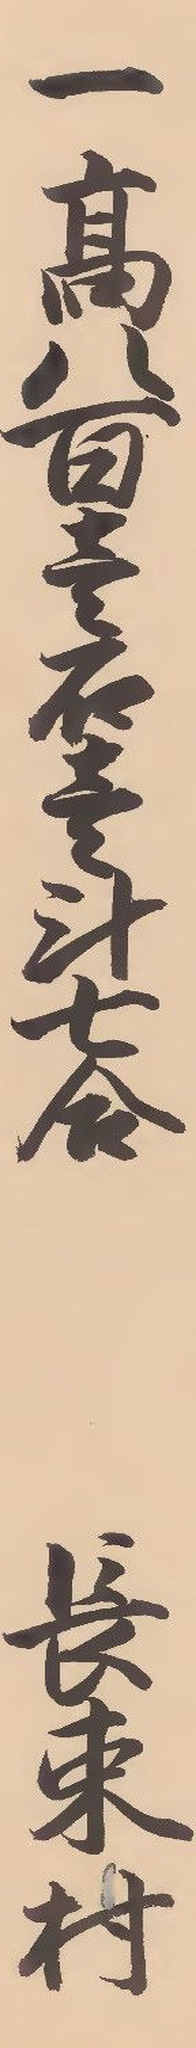一高八百壱石壱斗七合長束村
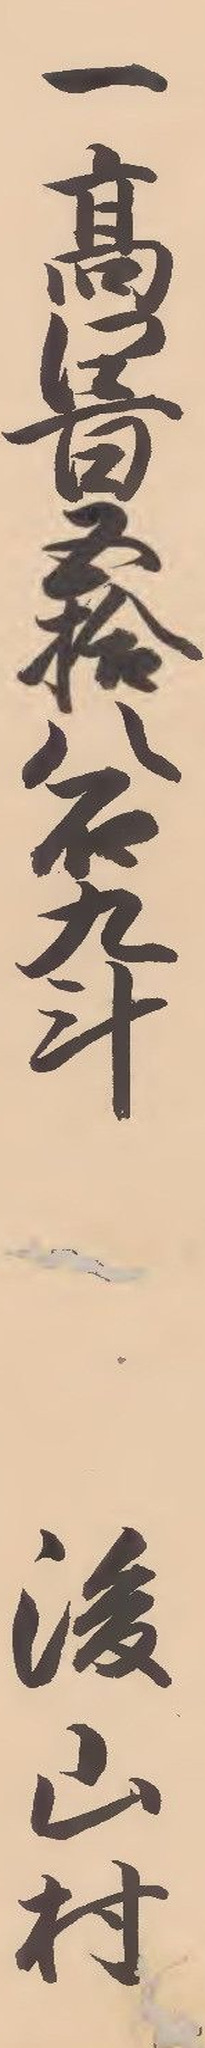一高四百五拾八石九斗後山村

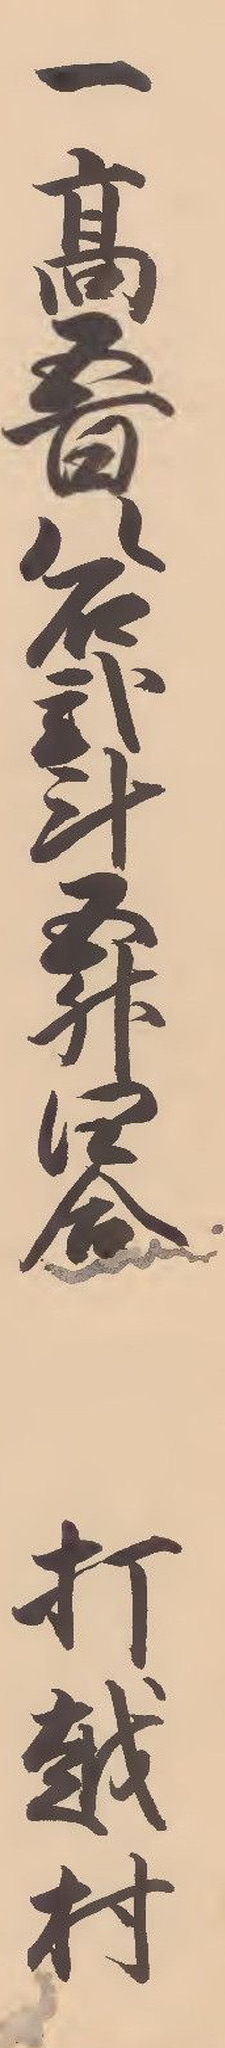一高五百八石弐斗五升四合打越村
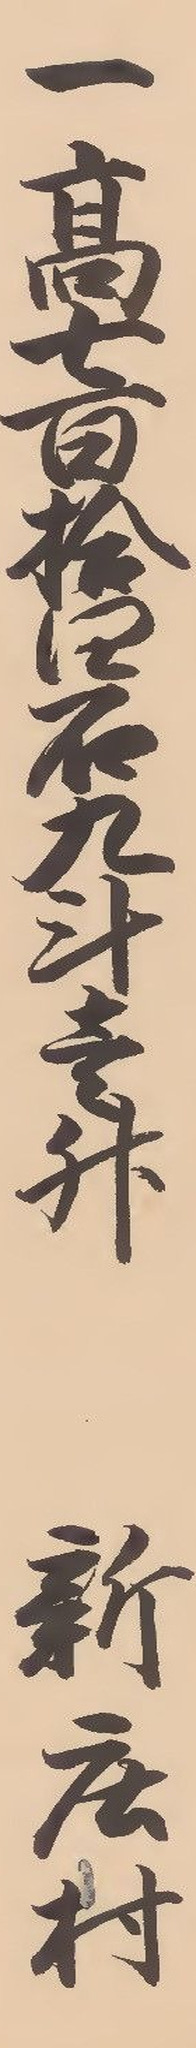一高七百拾四石九斗壱升新庄村
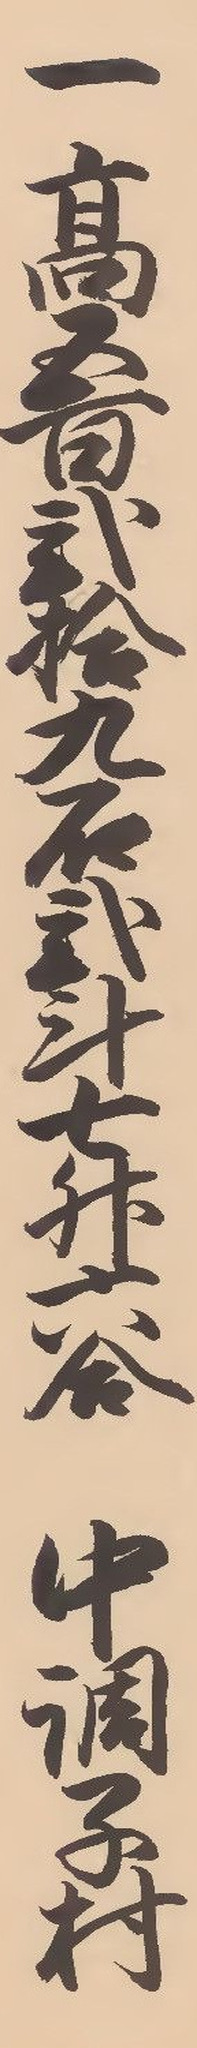一高五百弐拾九石弐斗七升六合中調子村
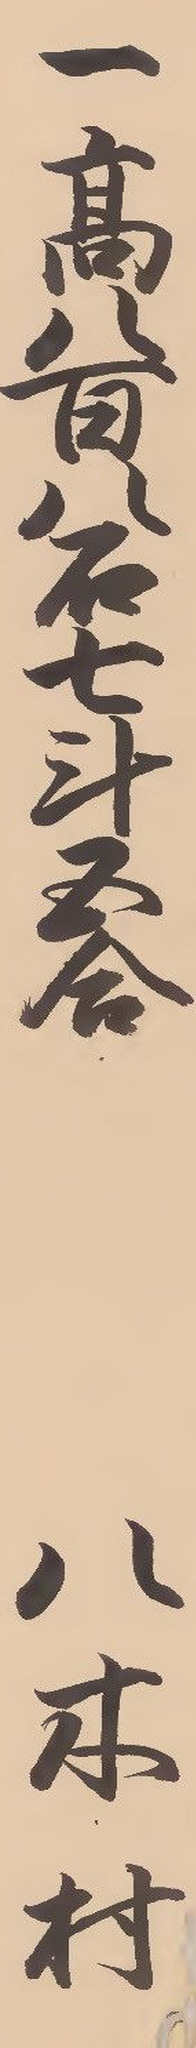一高八百八石七斗五合八木村
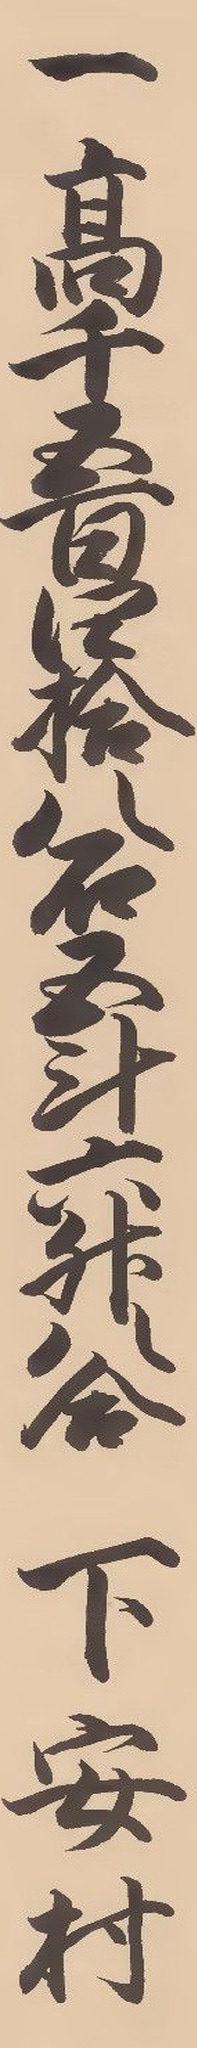一高千五百四拾八石五斗六升八合下安村
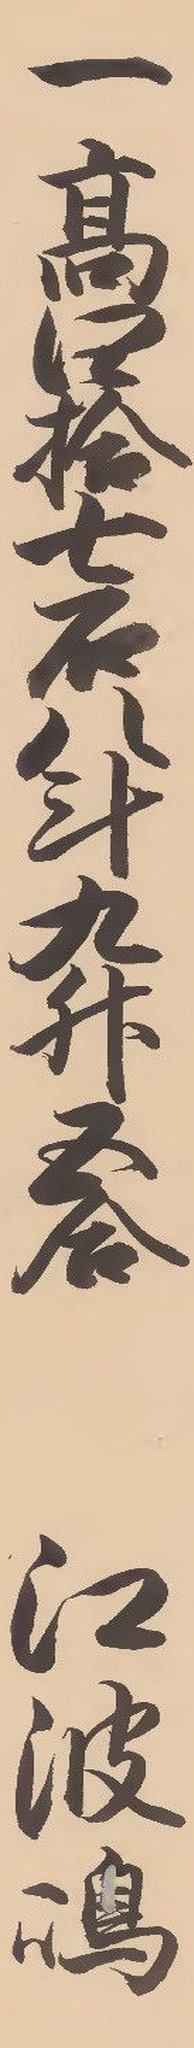一高四拾七石八斗九升五合江波島
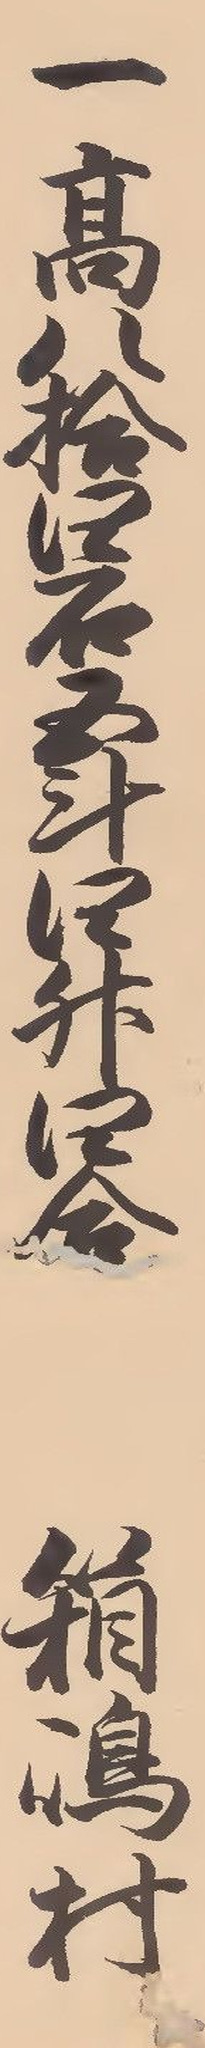一高八拾四石五斗四升四合箱島村
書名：安芸国郷帳
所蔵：国立公文書館 National Archives of Japan
